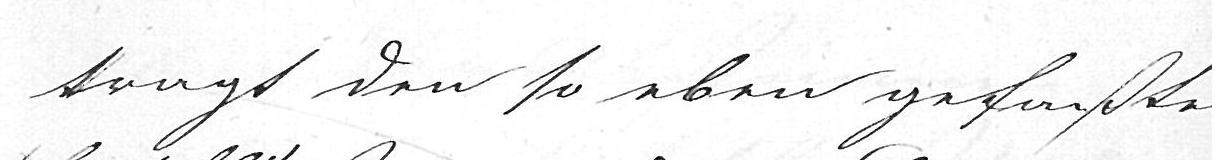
tragt den so eben gefaßten
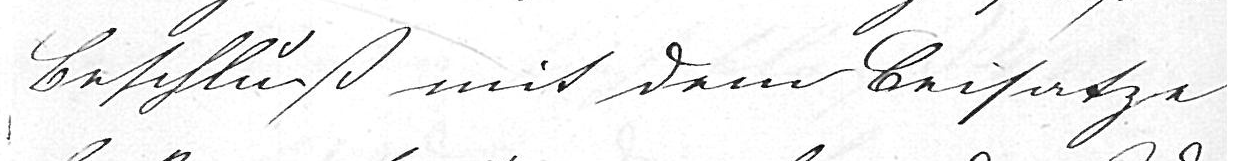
Beschluß mit dem Beisatze
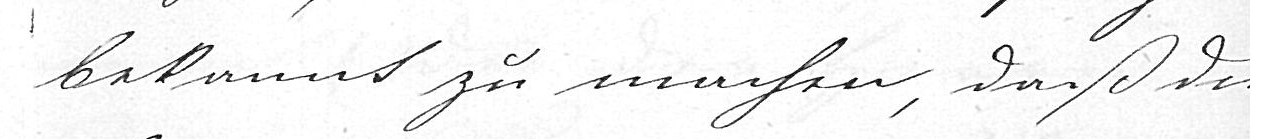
bekannt zu machen daß die
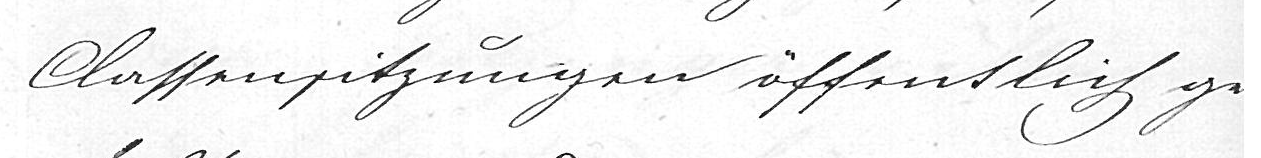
Classensitzungen öffentlich ge-
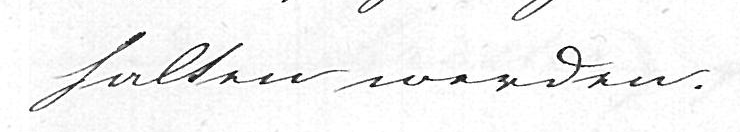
halten werden.
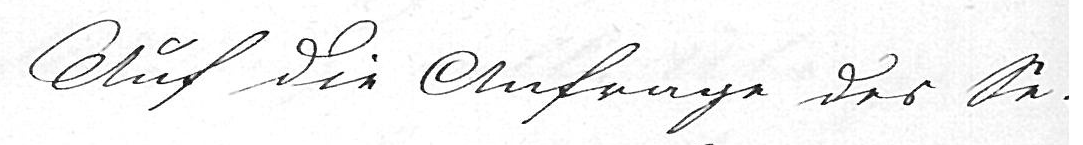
Auf die Anfrage des Se-
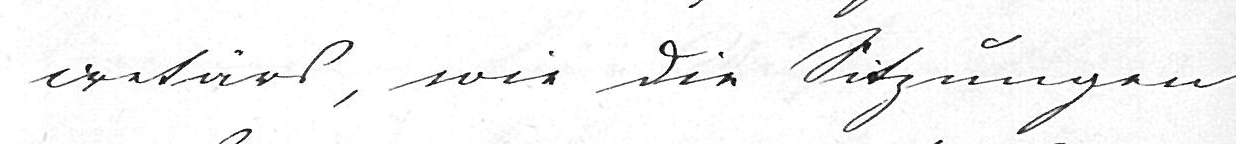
cretärs, wie die Sitzungen
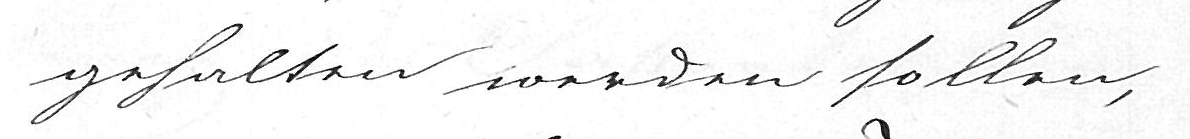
gehalten werden sollen,
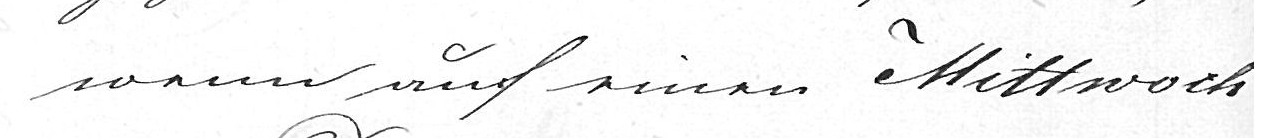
wenn aus einen Mittwoch
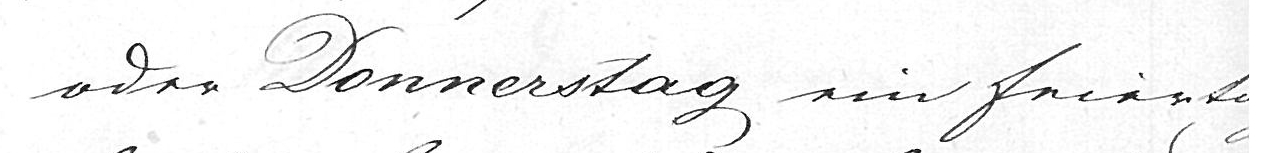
oder Donnerstag ein Feiertag
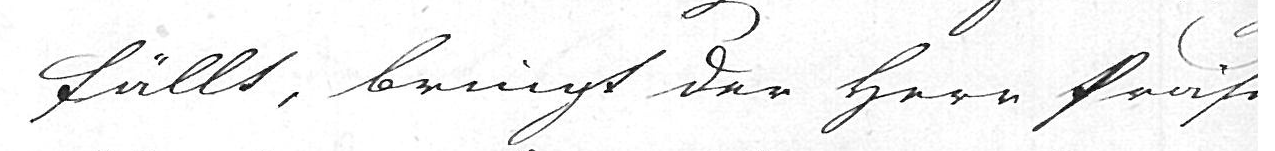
hält, bringt der Herr Präsi-
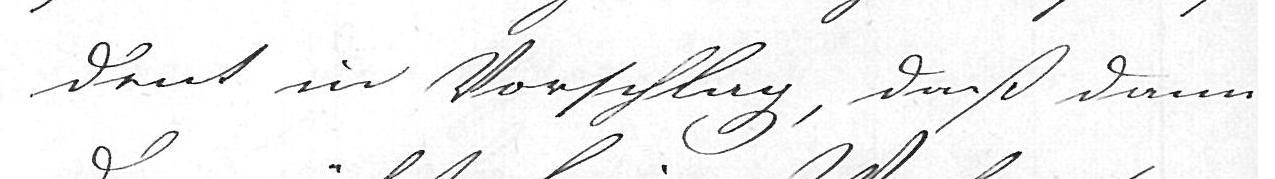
dent in Vorschlag, daß dann
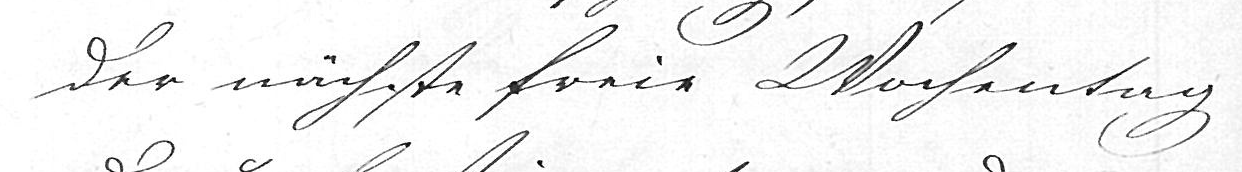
der nächsten freie Wochentag
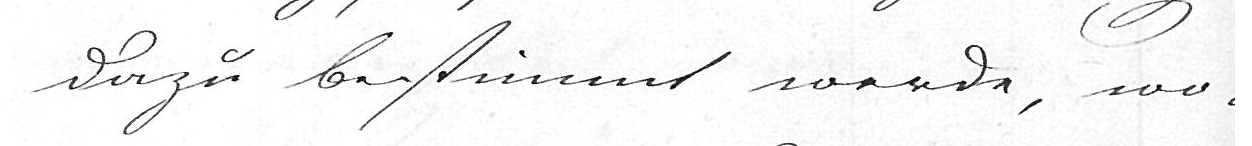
dazu bestimmt werde, wo-
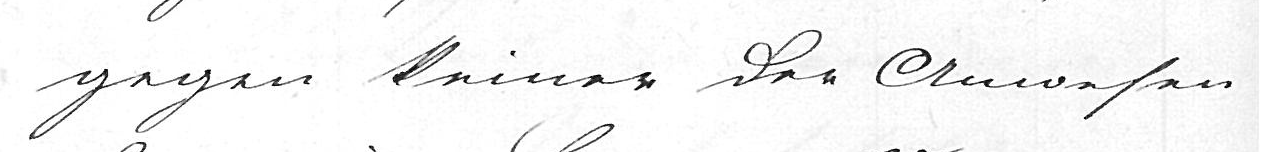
gegen keiner der Anwesen-
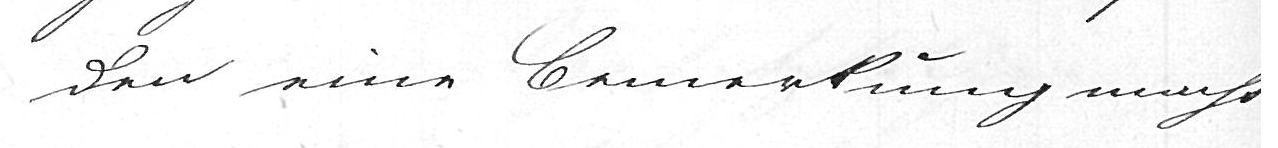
den eine Bemerkung macht.
